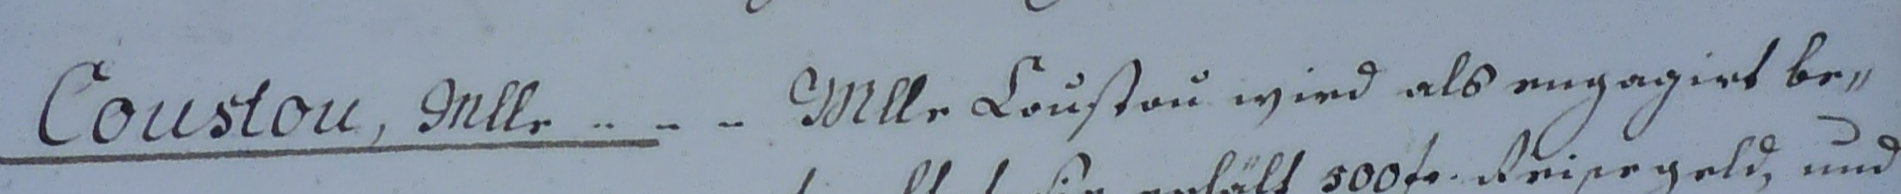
Coustou, Mlle .. .. .. Mlle Coustou wird als engagirt be¬
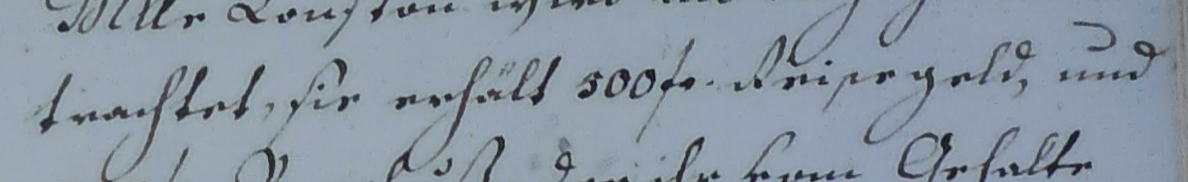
trachtet, sie erhält 500fr. Reisegeld, und
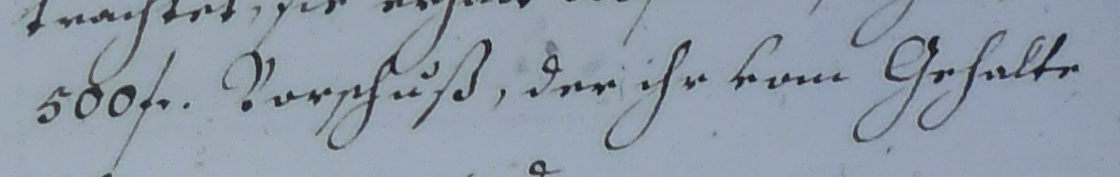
500fr. Vorschuß, der ihr vom Gehalte
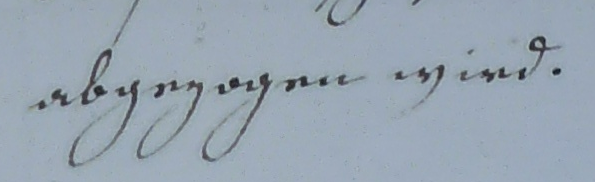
abgezogen wird.
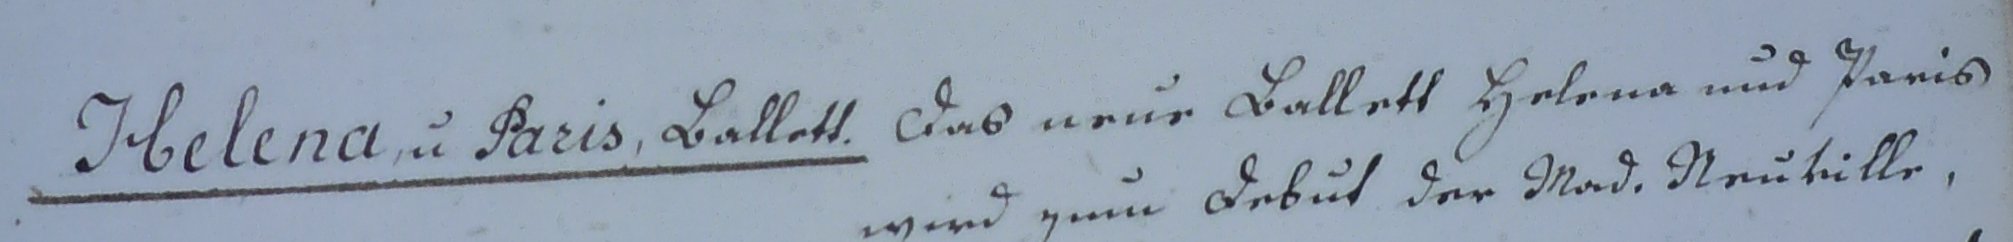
Helena, u Paris, Ballett. Das neue Ballett Helena und Paris
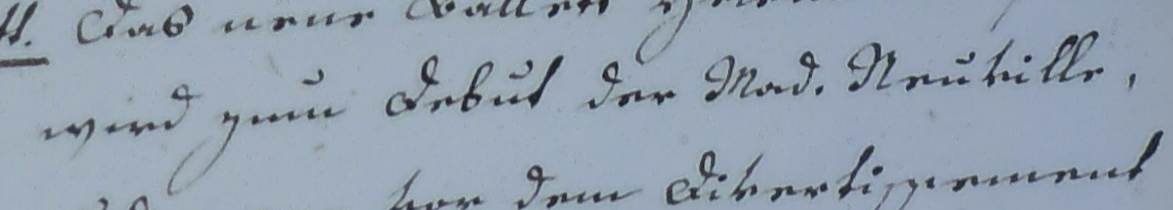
wird zum Debut der Mad. Neuville,
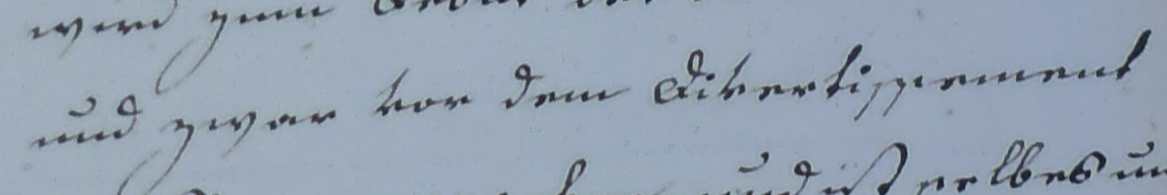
und zwar vor dem Divertissement
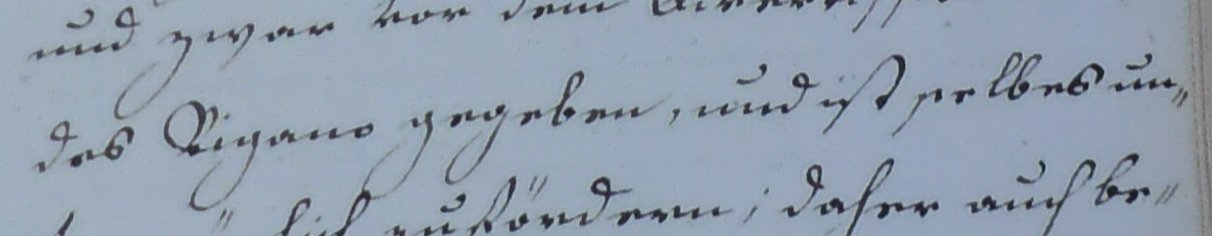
des Vigano gegeben, und ist selbes un¬
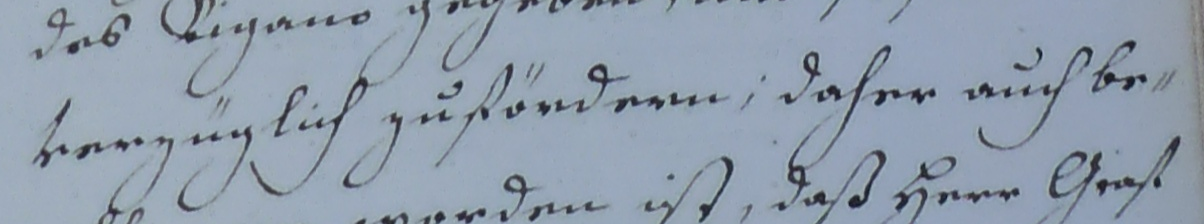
verzüglich zufördern, daher auch be¬
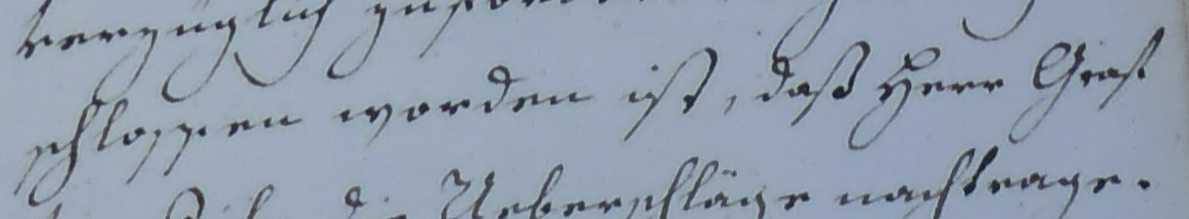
schlossen worden ist, daß Herr Graf
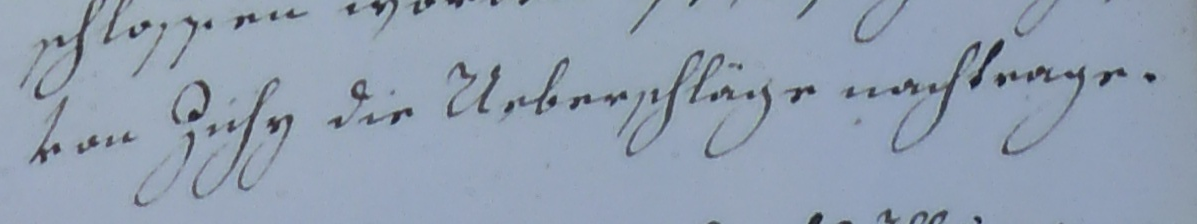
von Zichy die Ueberschläge nachtrage.
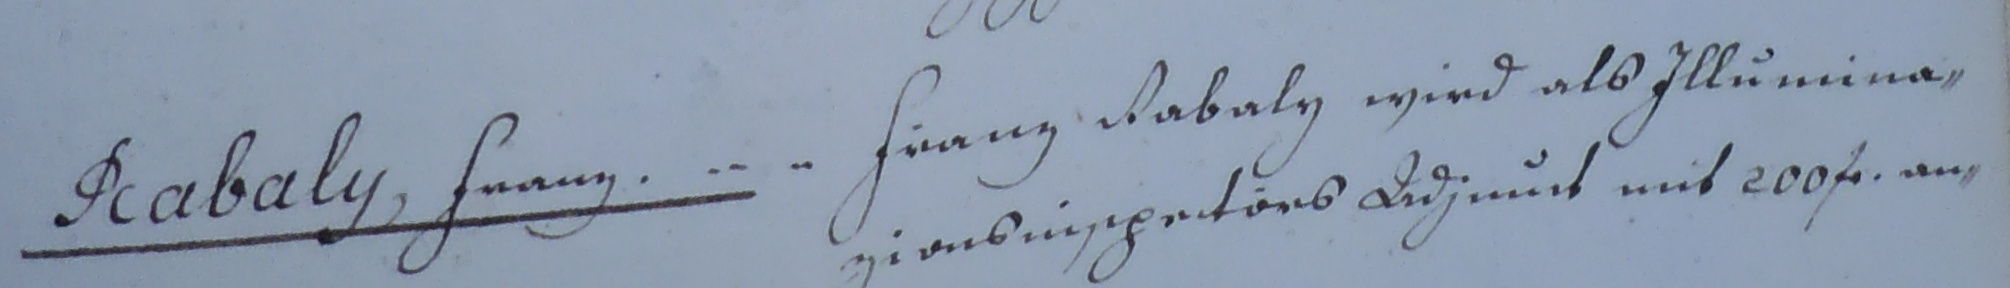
Rabaly, Franz. .. .. Franz Rabaly wird als Illumina¬
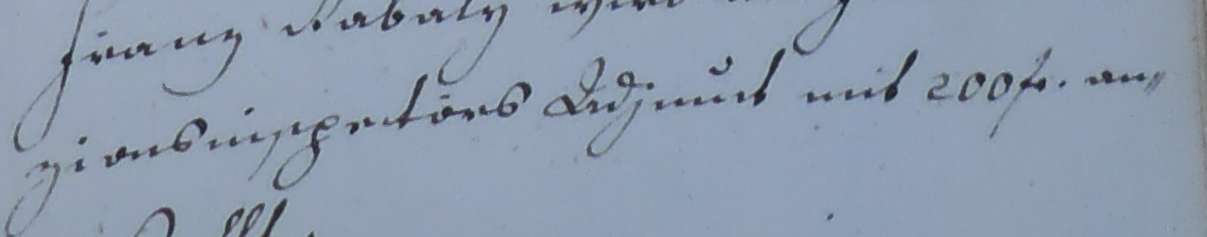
zionsinspectors Adjunct mit 200fr. an¬
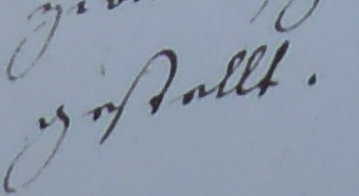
gestellt.
